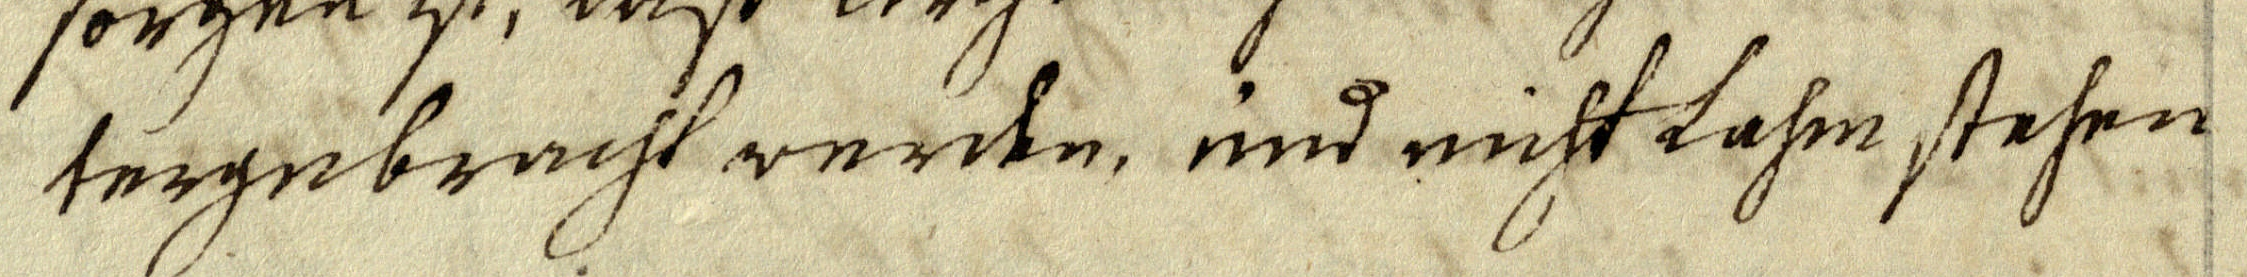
tergebracht werden und nicht lahm stehen
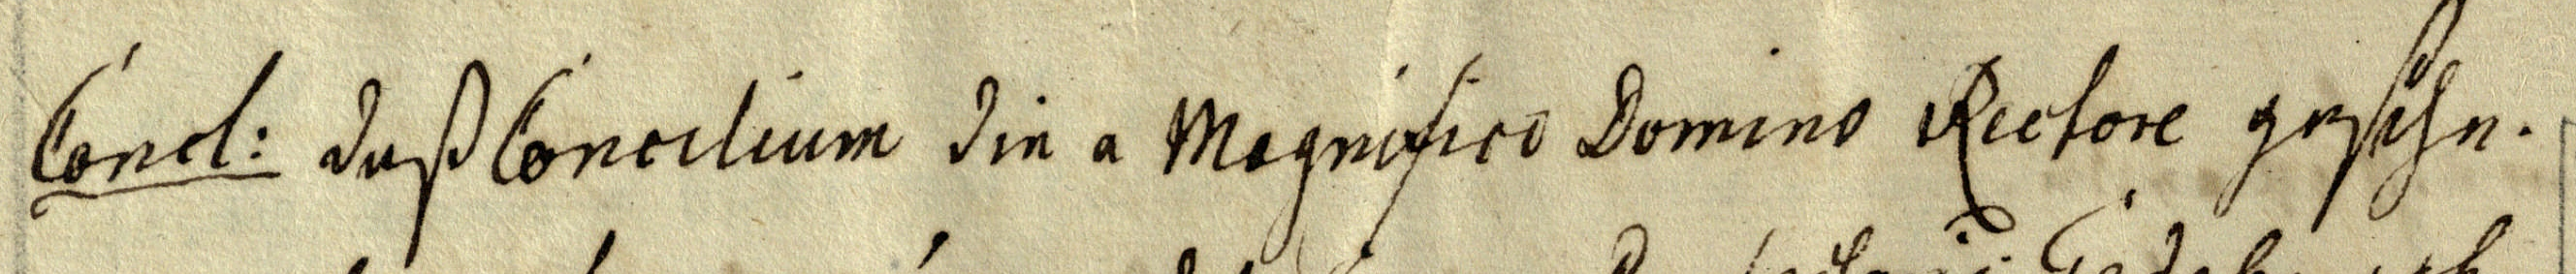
Concl: daß Concilium die a Magnifico Domino Rectore gesche¬
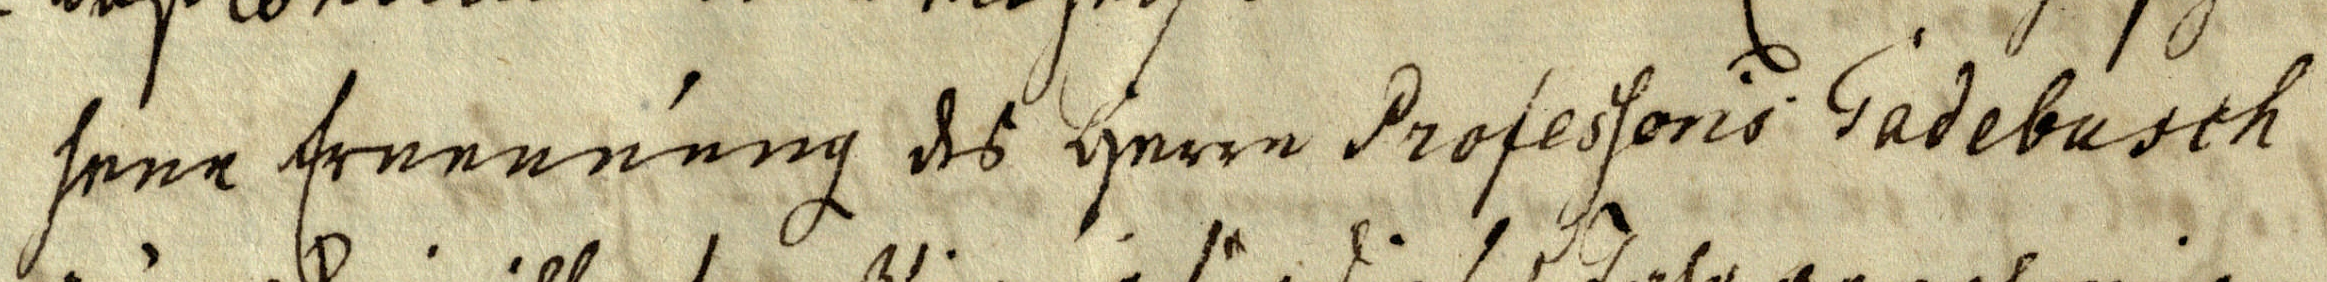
hene Ernennung des Herrn Professoris Gadebusch
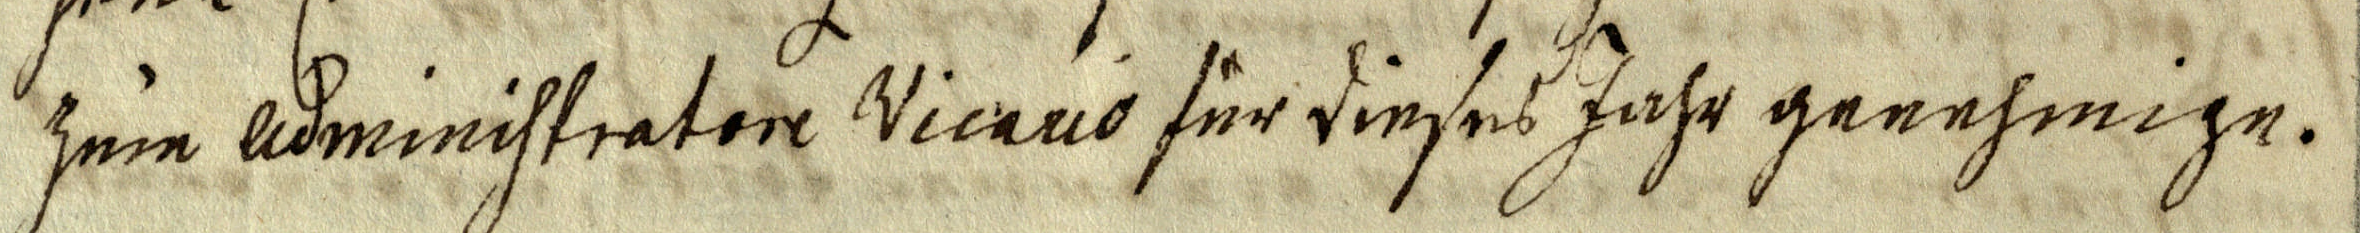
zum Administratore Vicario für dieses Jahr genehmige.
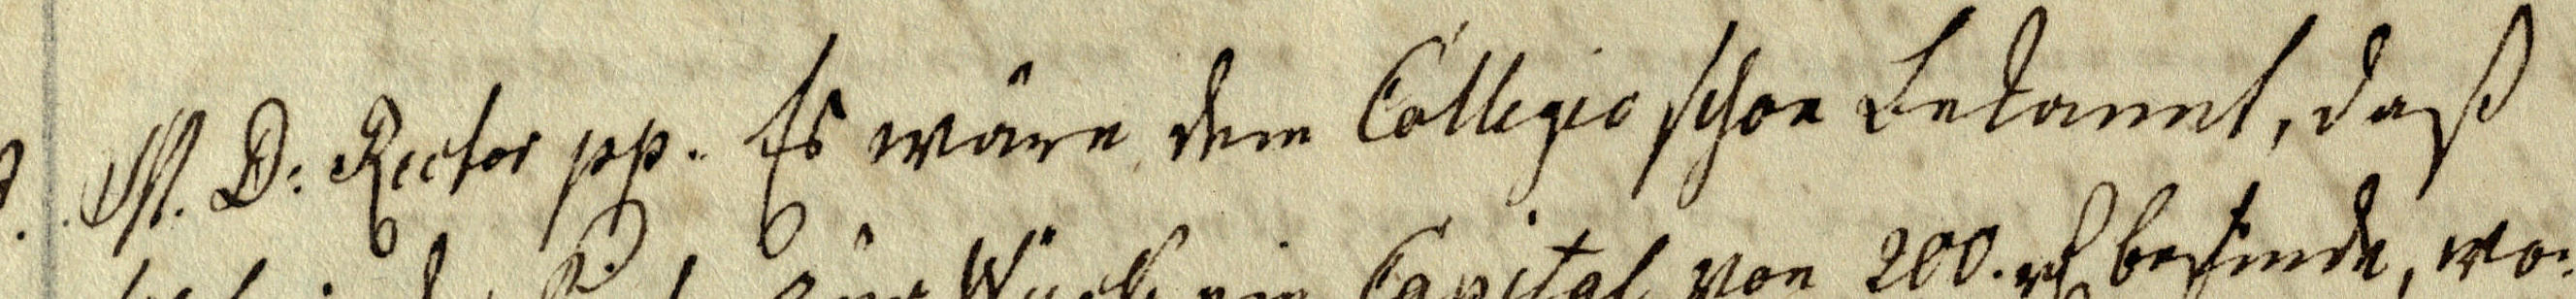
2. M. D. Rector pp. Es wäre dem Collegio schon bekannt,daß
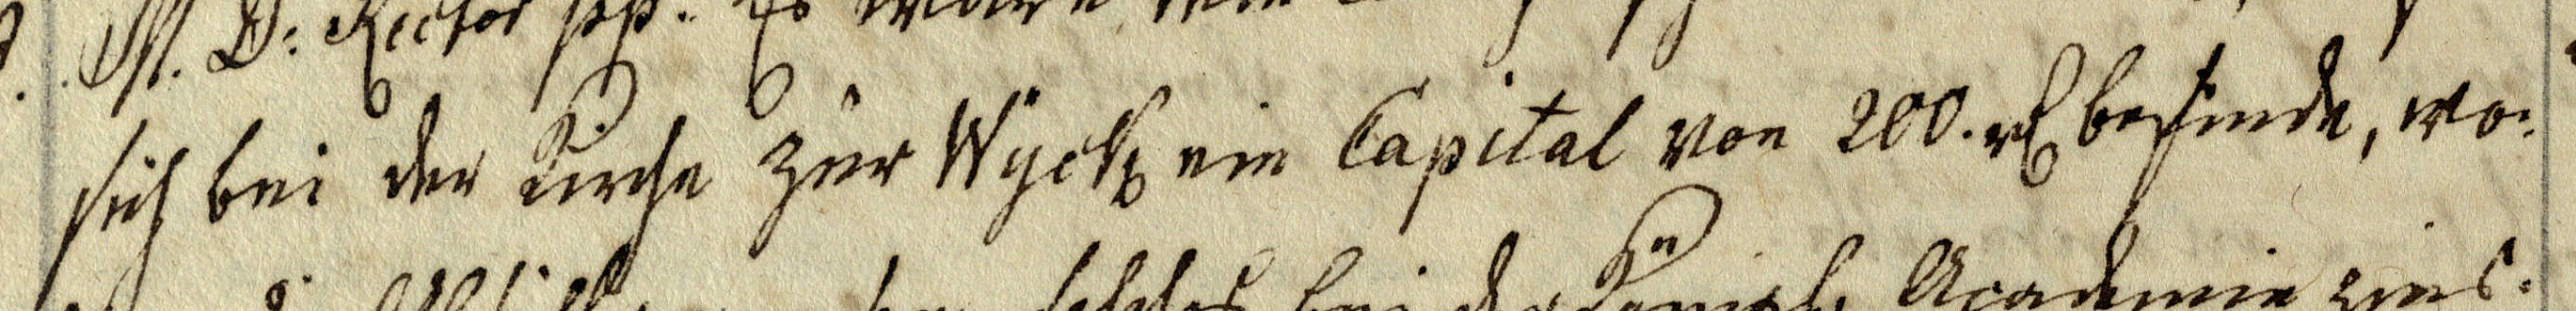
sich bei der Kirche zur Wÿck ein Capital von 200. r befinde, wo¬
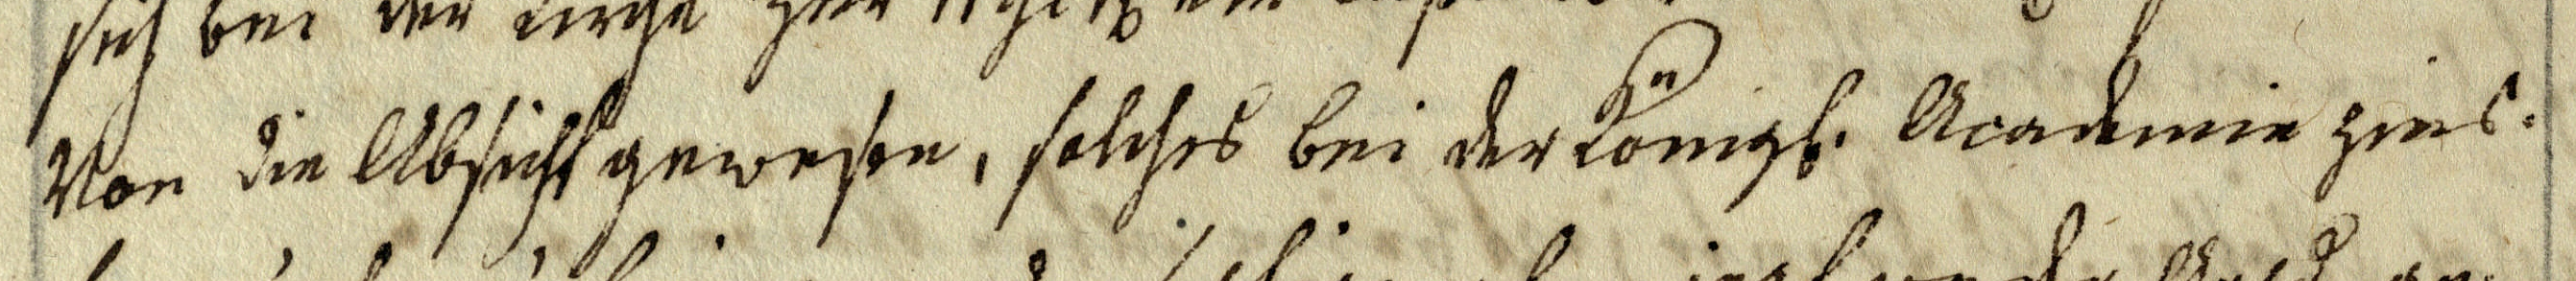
vor die Absicht gewesen, solches bei der Königl Academie zins¬
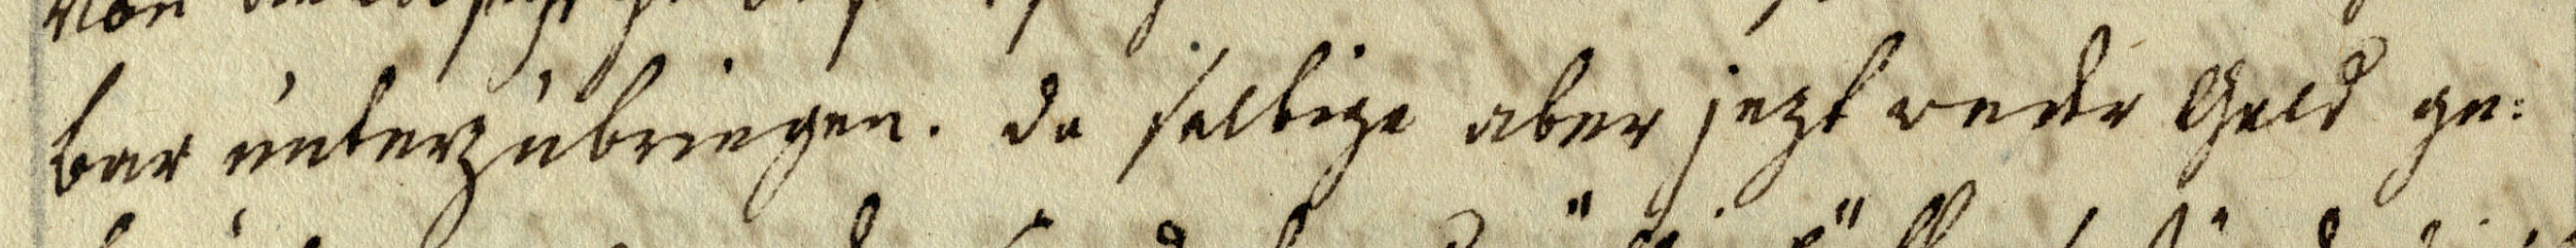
bar unterzubringen. Da selbige aber jezt weder Geld ge¬
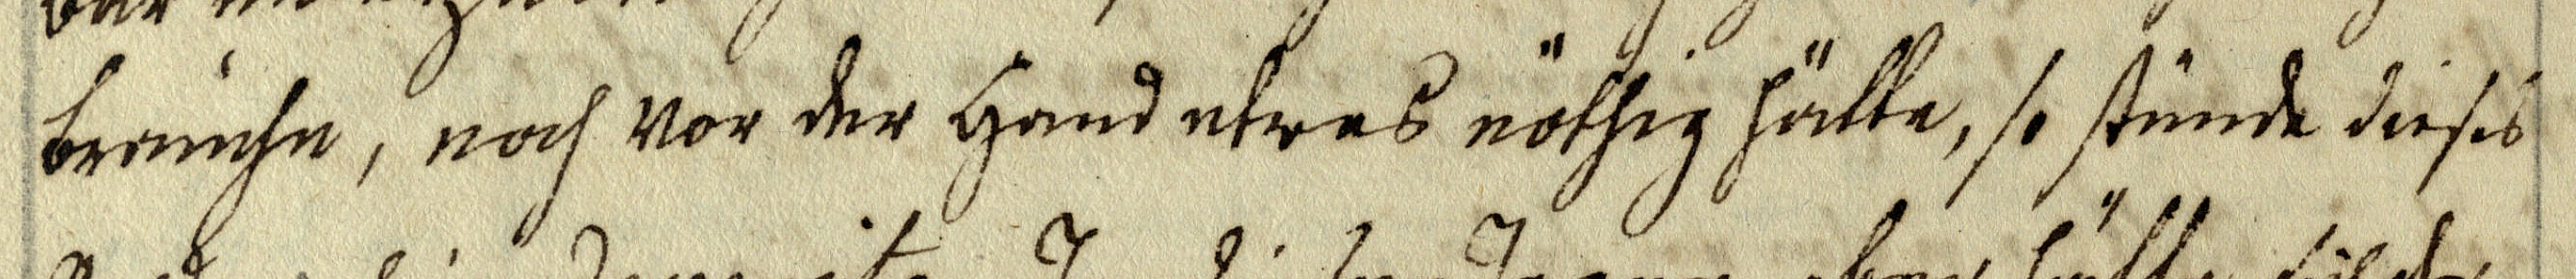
brauche, nochvor der Hand etwasnöthig hätte, so stünde dieses
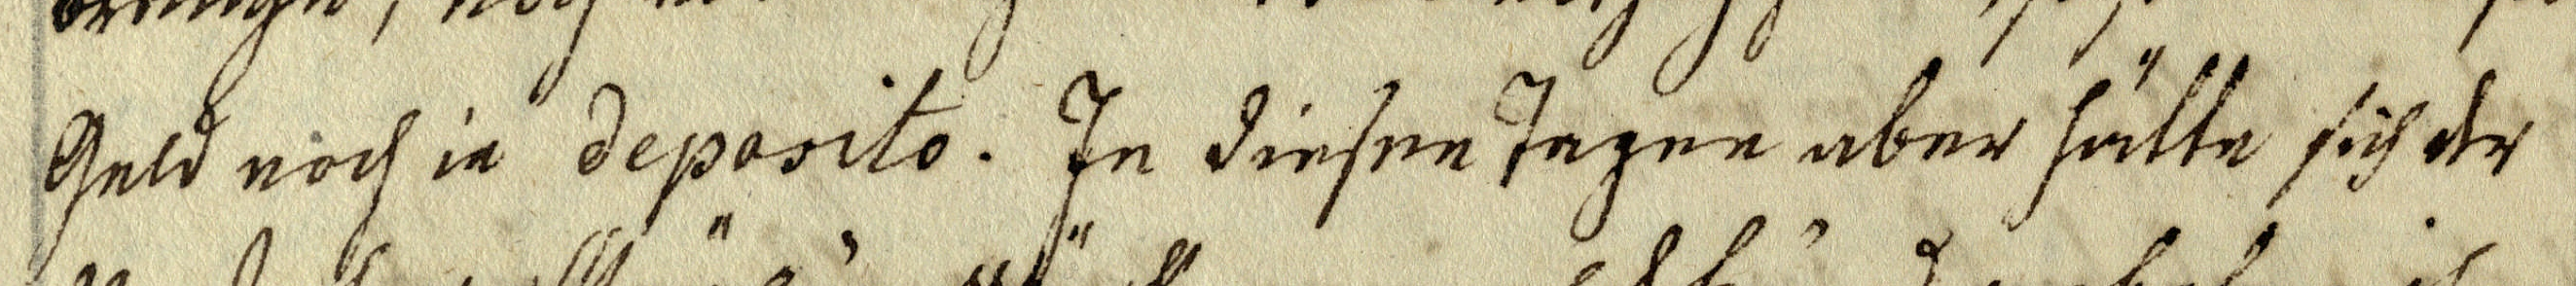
Geld noch in deposito. In diesen Tagen aber hätte sich der
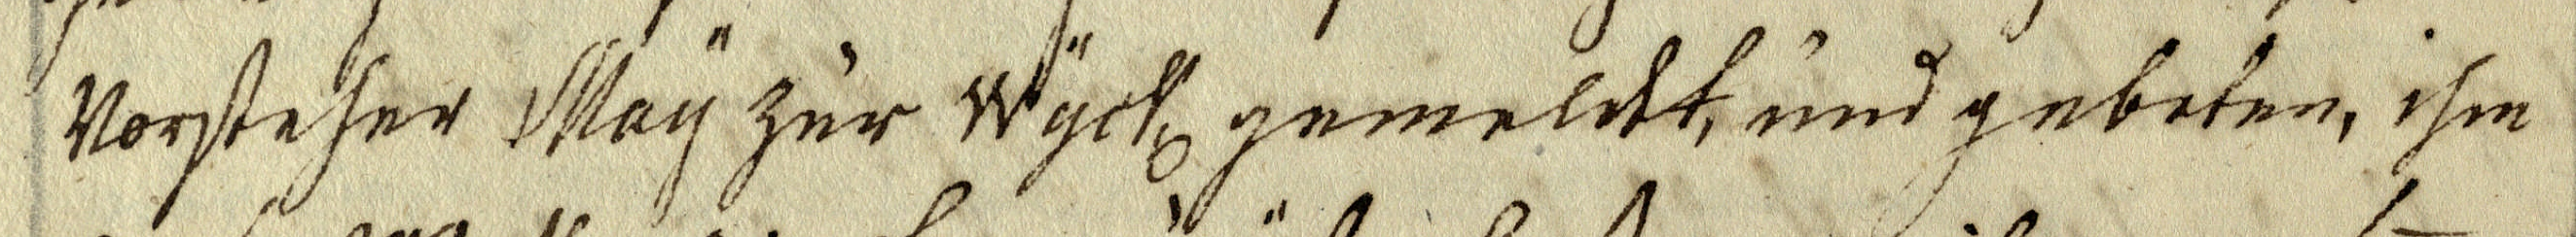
Vorsteher Maÿ zur Wÿck gemeldet, und gebeten, ihm
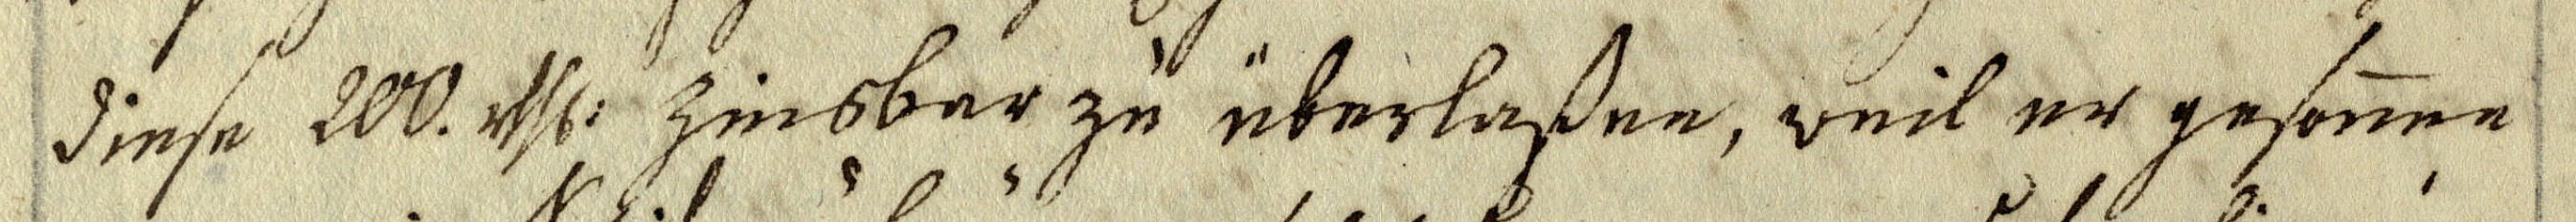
diese 200 r: zinsbar zu überlaßen, weil er gesonen
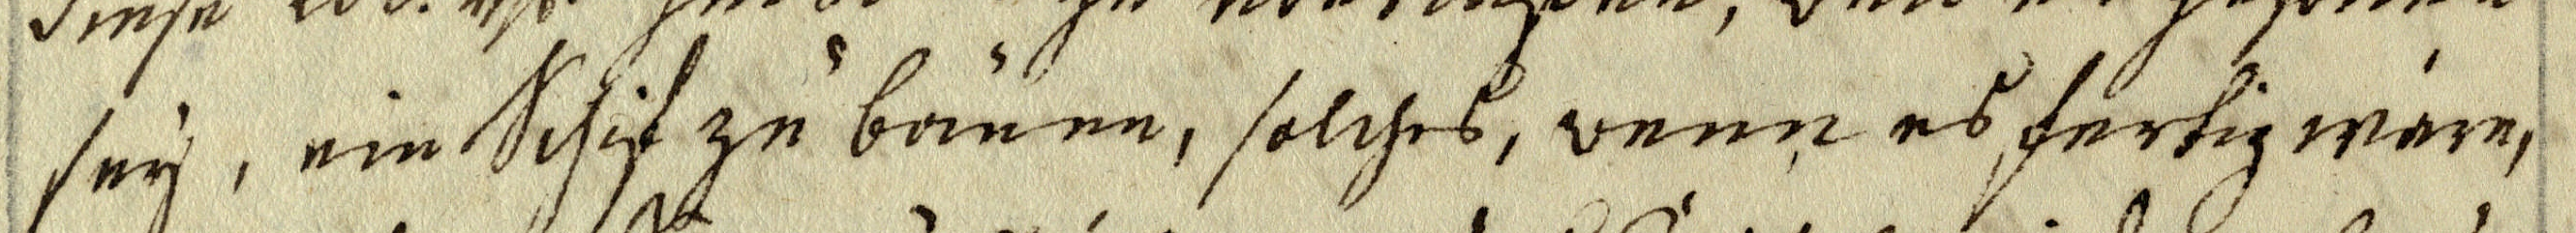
seÿ, ein Schif zu bauen, solches, wenn es fertig wäre,
